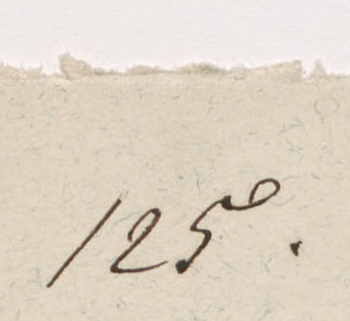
125.
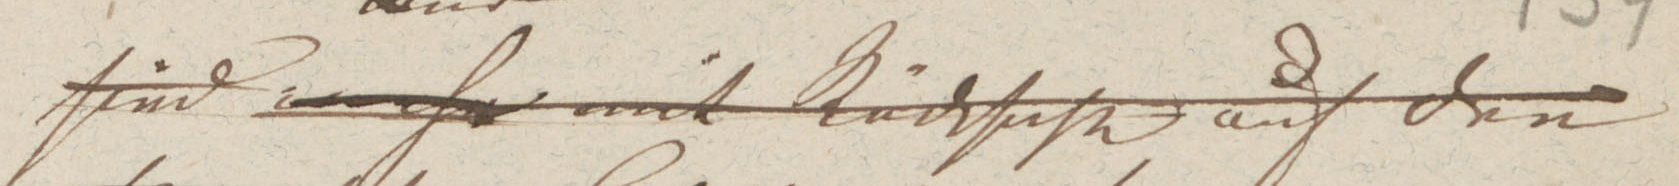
sind wur mehr mit Rücksicht auf den
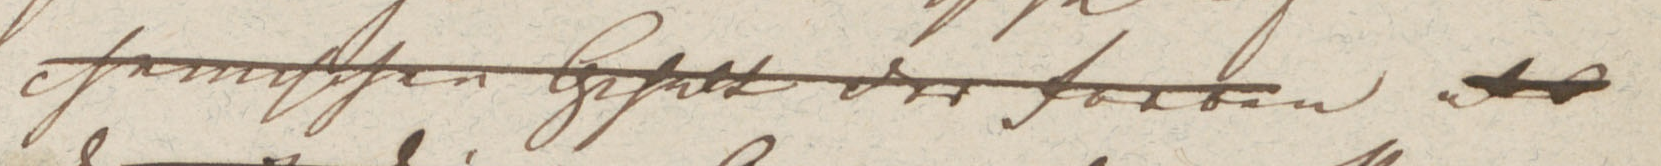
chemischen Gehalt der Farben als
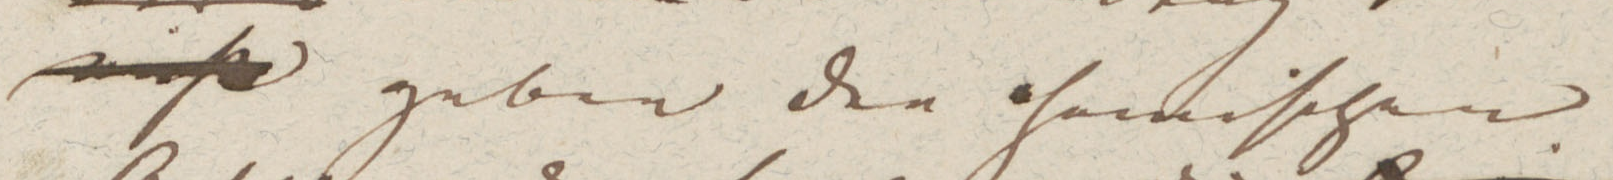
nicht geben den chemischen
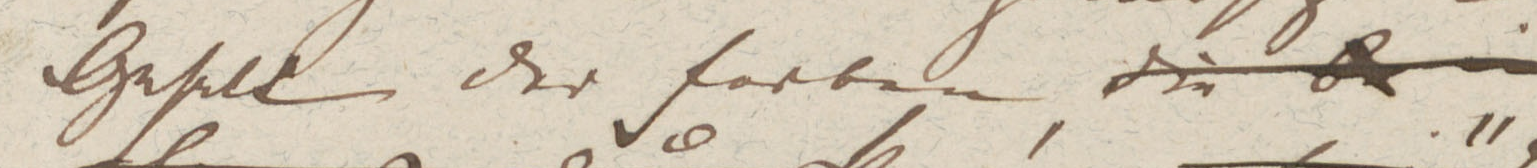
Gehalt der Farben, die be in
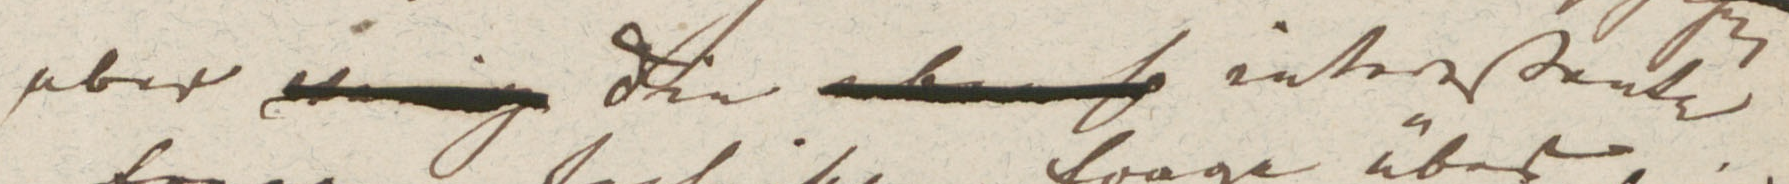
aber wenig die eben so interessante
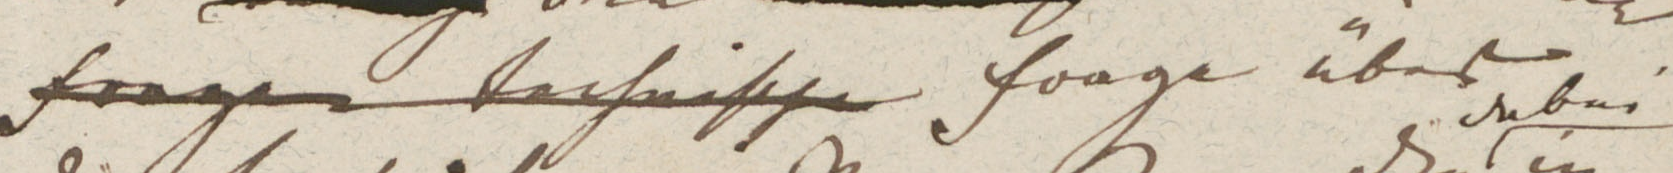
Fragen technische Frage über
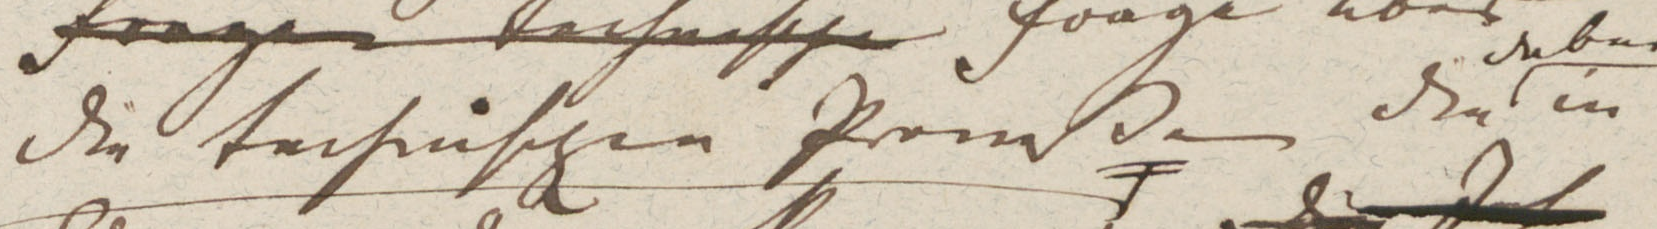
die technischen Processe die dabei in
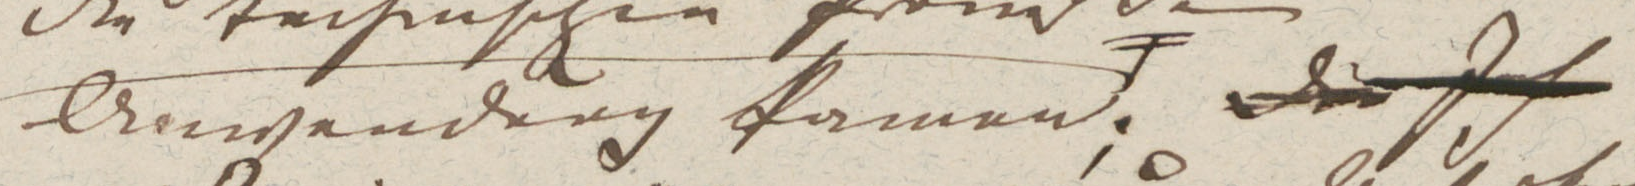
Anwendung kamen%%; Die Ich
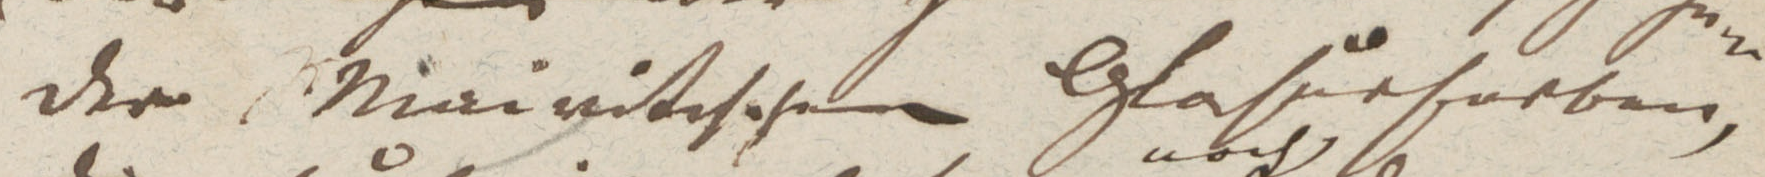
der Ninivitischen Glasurfarben,
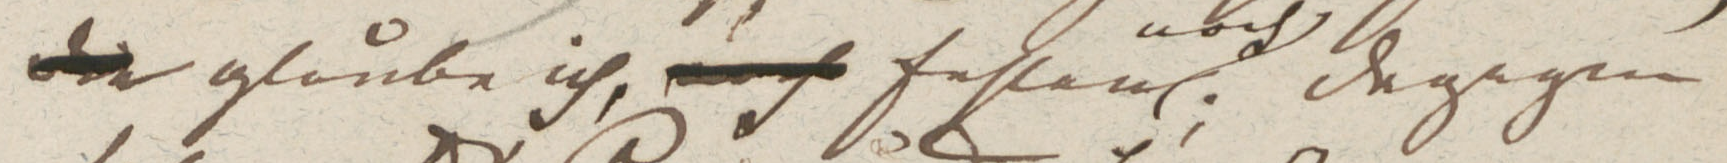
die glaube ich, noch fehlen noch; Dagegen
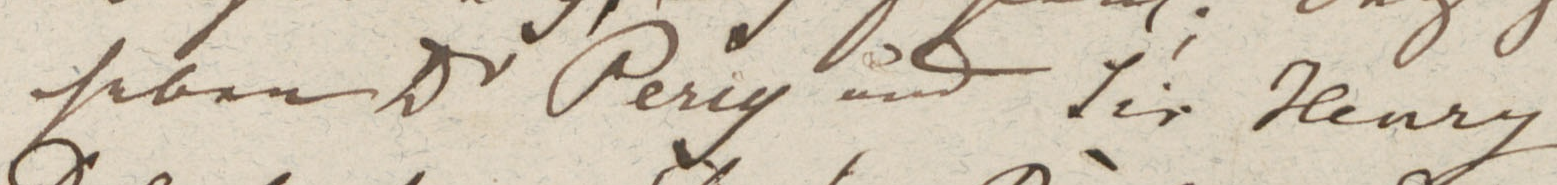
haben Dr Percy und Sir Henry
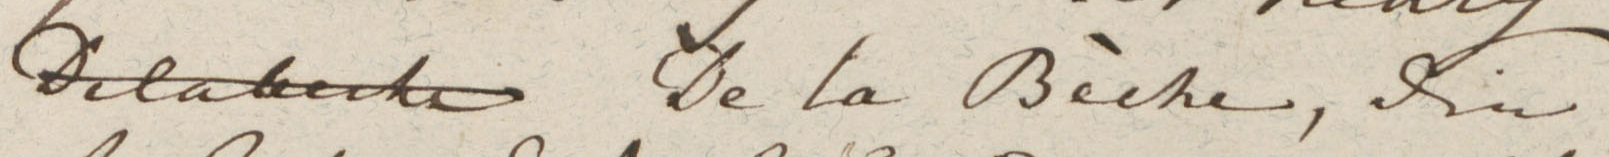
Delabeche De la Bèche, die
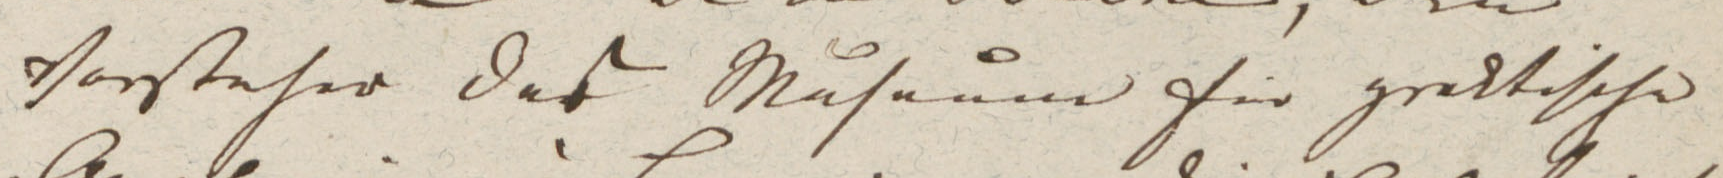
Vorsteher ders Museum für praktische
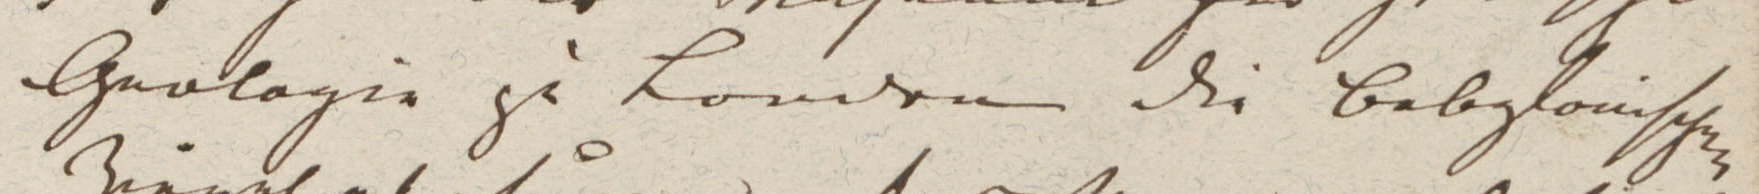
Geologie zu London die Babylonischen
